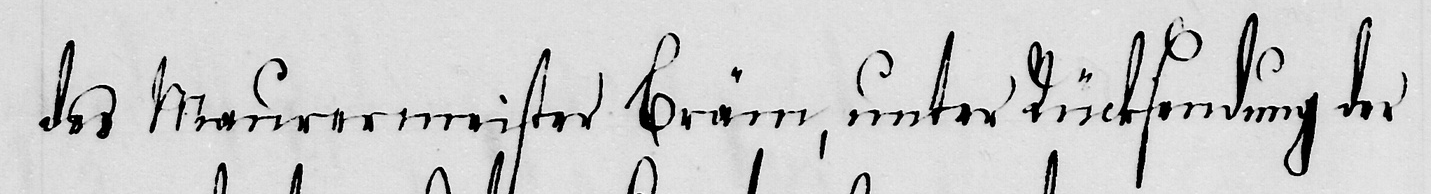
des Maurermeister Bräm, unter Rücksendung der
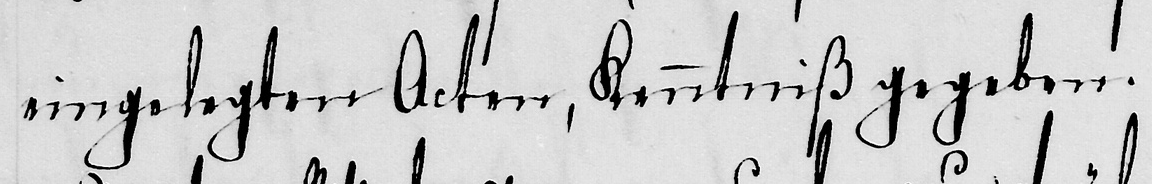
eingelegten Acten, Kenntniß gegeben.
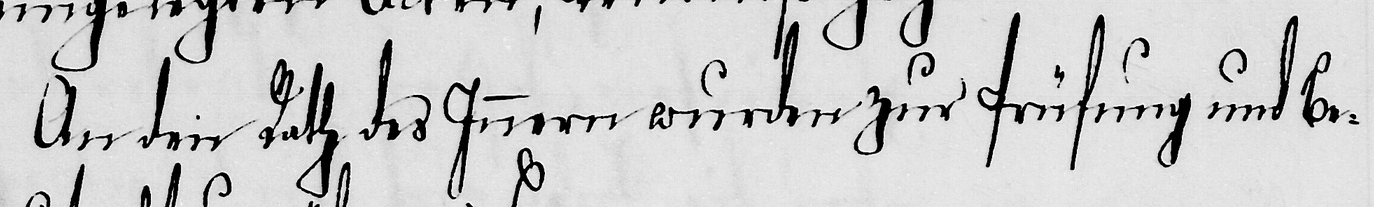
An den Rath des Innern wurden zur Prüfung und Be¬
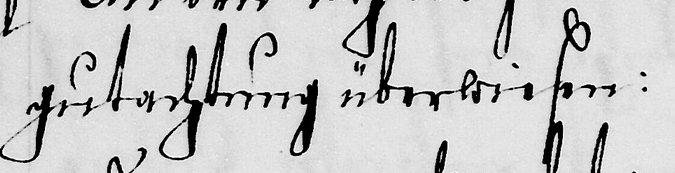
gutachtung überwiesen:
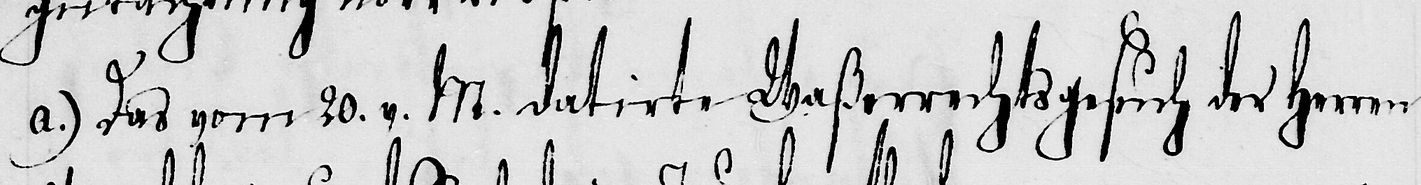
a.) Das vom 20. v. M. datirte Waßerrechtsgesuch der Herr¬
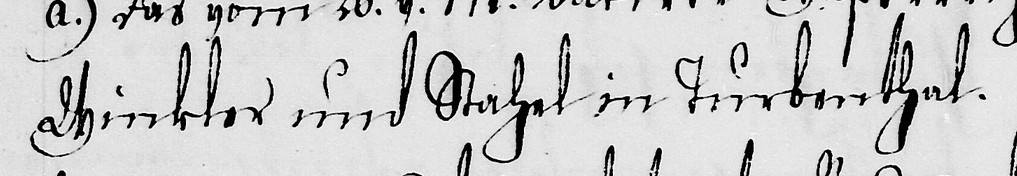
Winkler und Stahel in Turbethal.
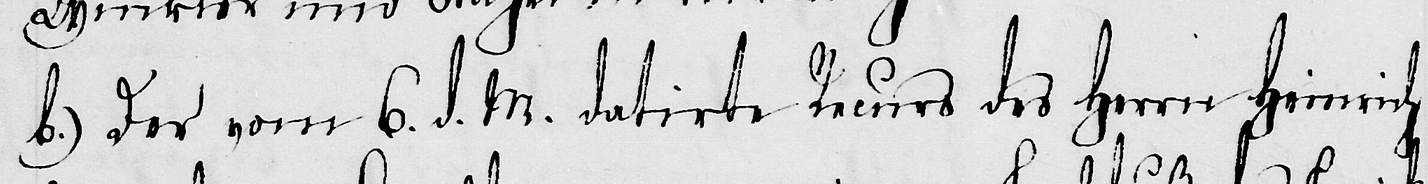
b.) Der vom 6. d. M. datirte Recurs des Herrn Heinrich
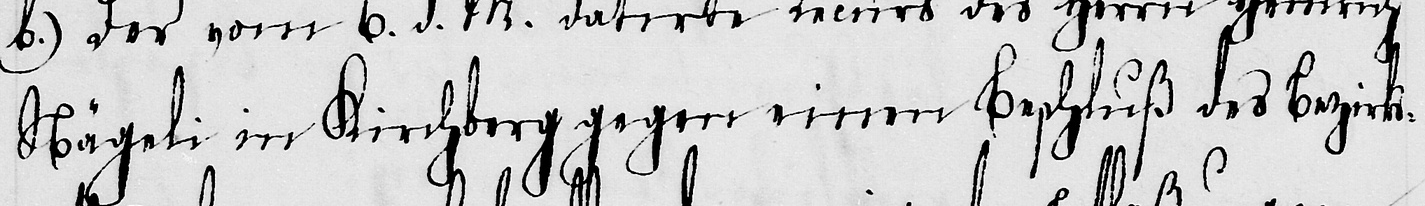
Nägeli in Kirchberg gegen einen Beschluß des Bezirks¬
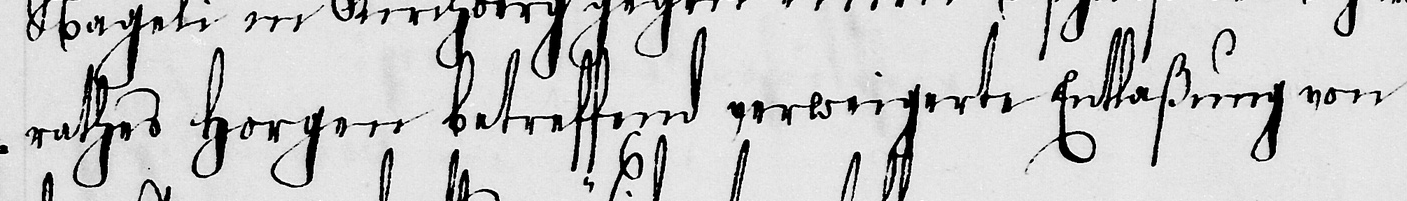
rathes Horgen betreffend verweigerte Entlaßung von
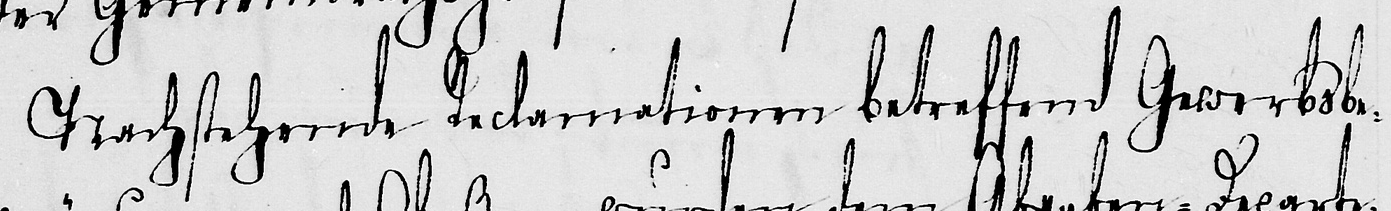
Nachstehende Reclamationen betreffend Gewerbsbe¬
